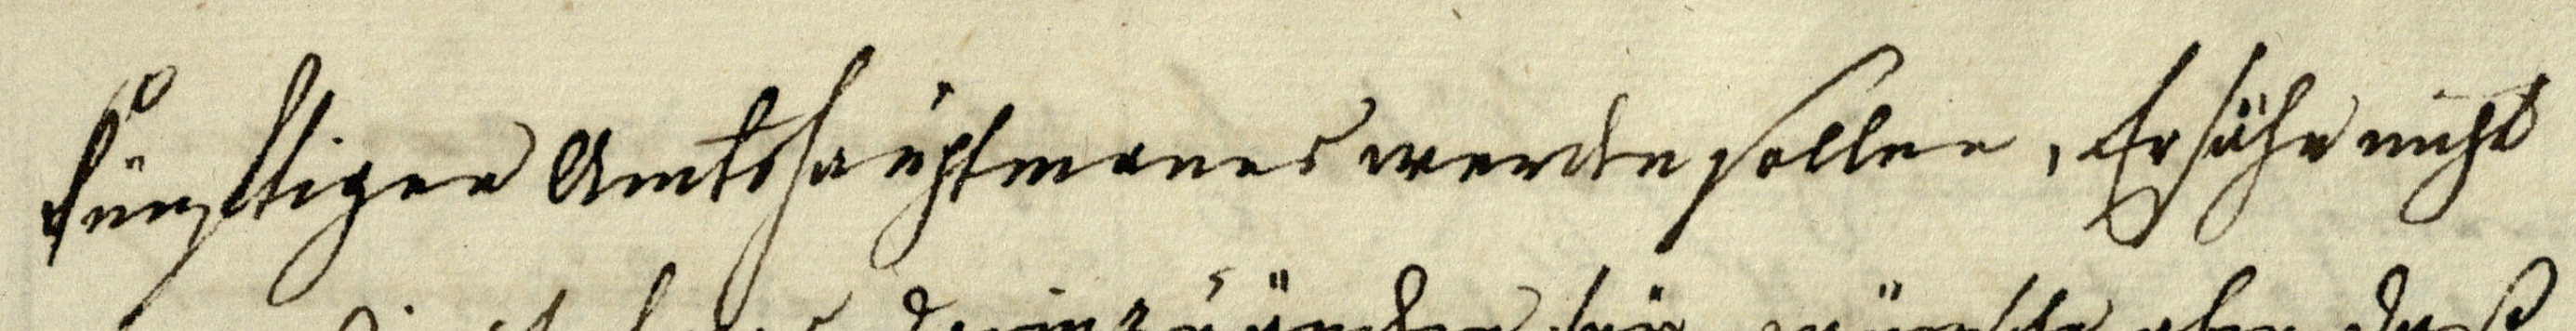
künftigen Amtshauptmanns werden sollen, Er sähe nicht
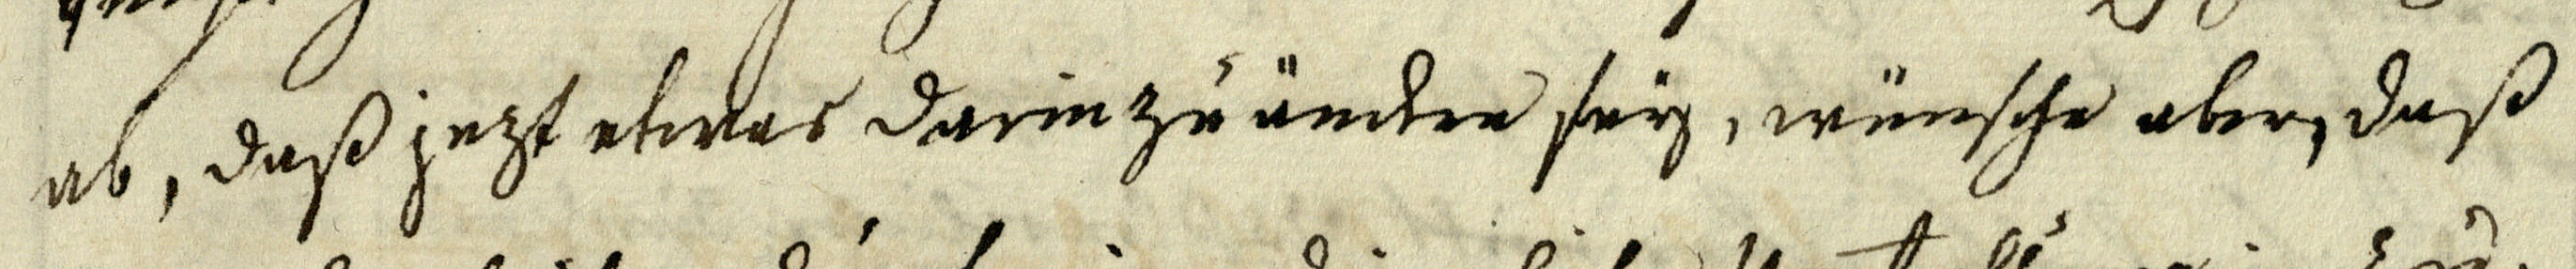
ab, daßjezt etwas darin zu ändern seÿ, wünsche aber, daß
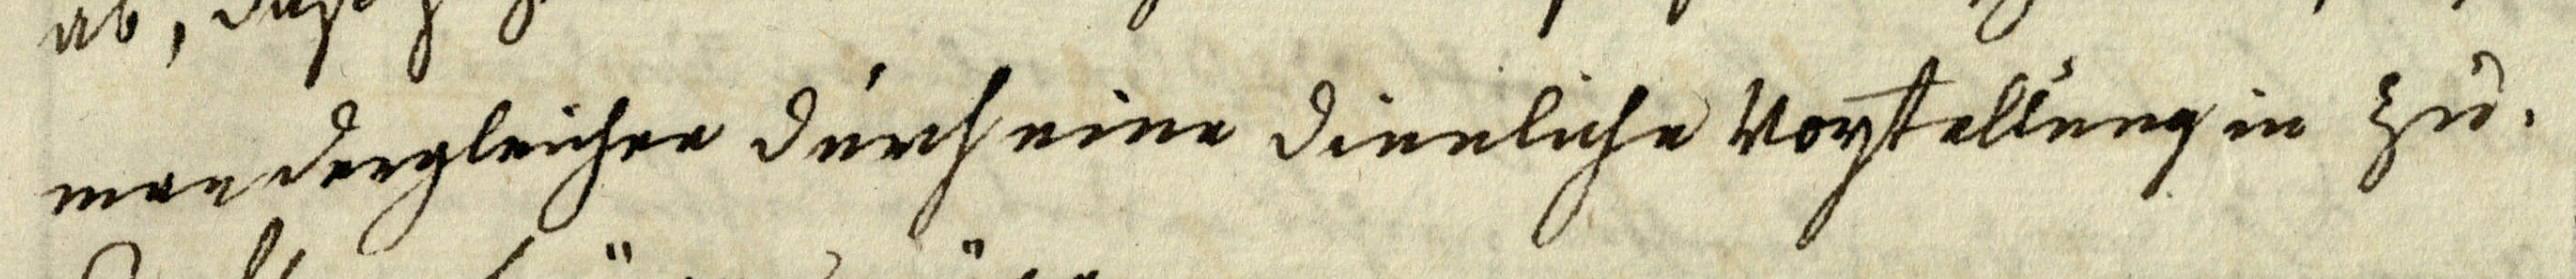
man dergleichen durch eine dienliche Vorstellung in Zu¬
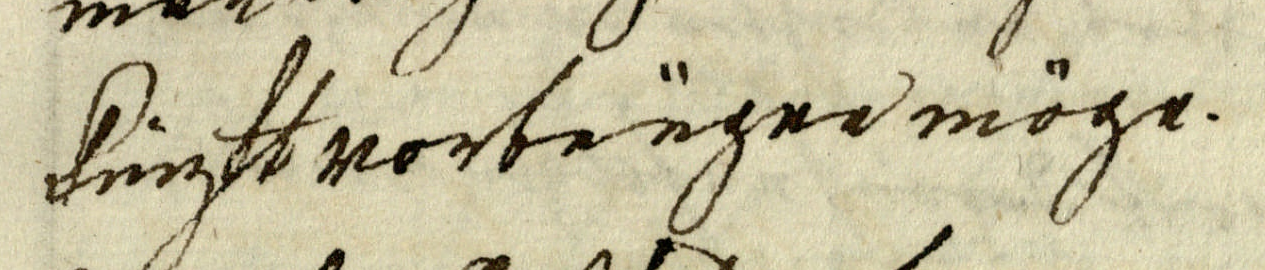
kunft vorbeugen möge.
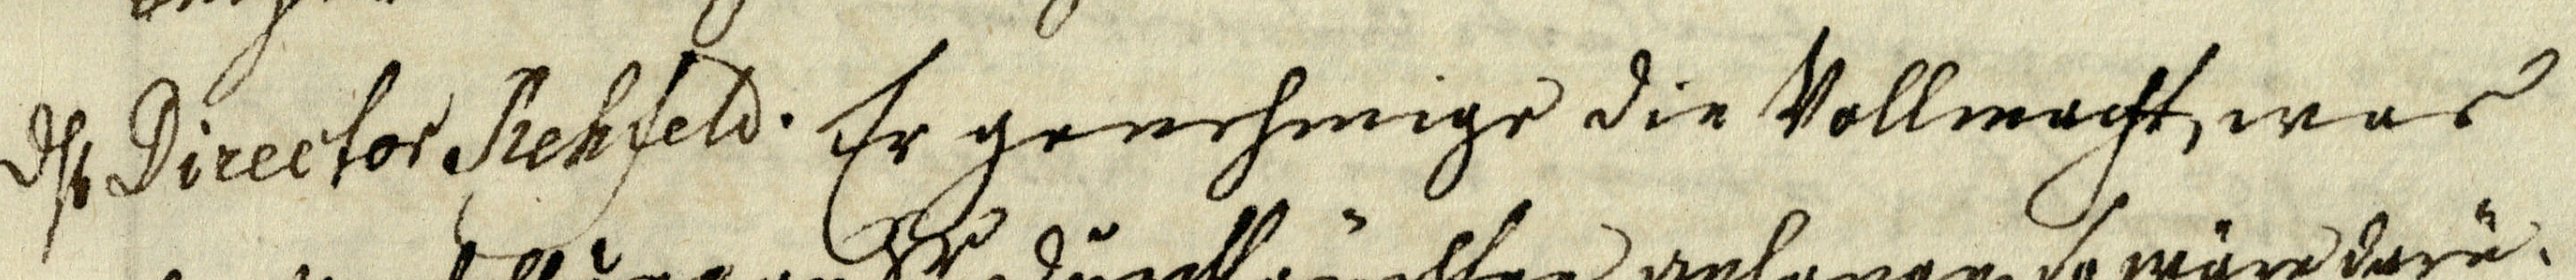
dh. Director Rehfeld. Er genehmige die Vollmacht, was
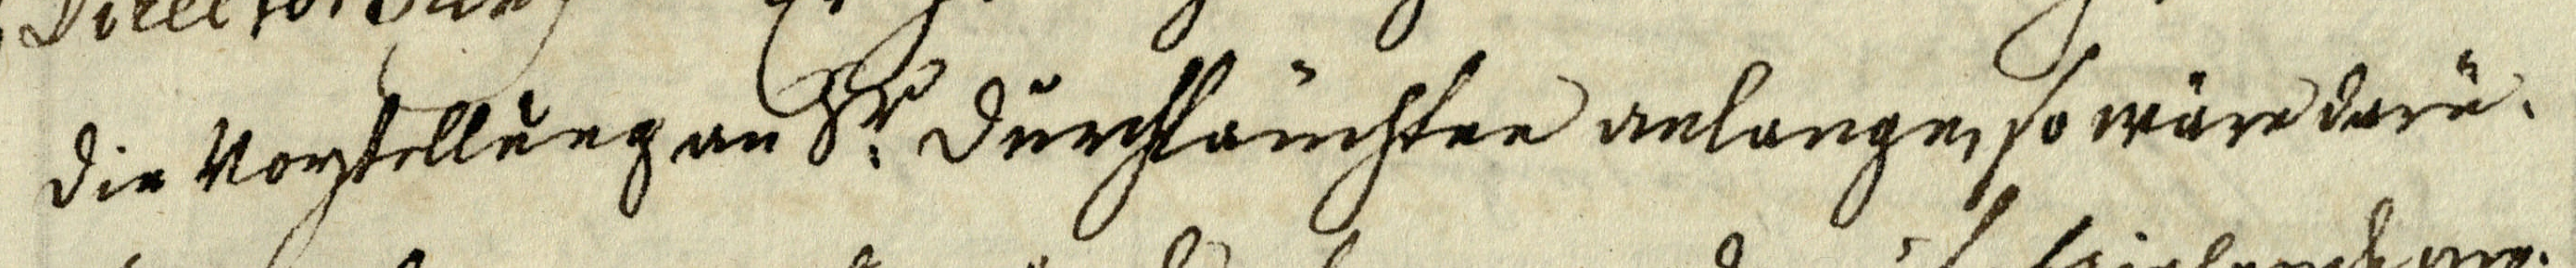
die Vorstellung an Sr Durchlauchten anlange, so wäre darü¬
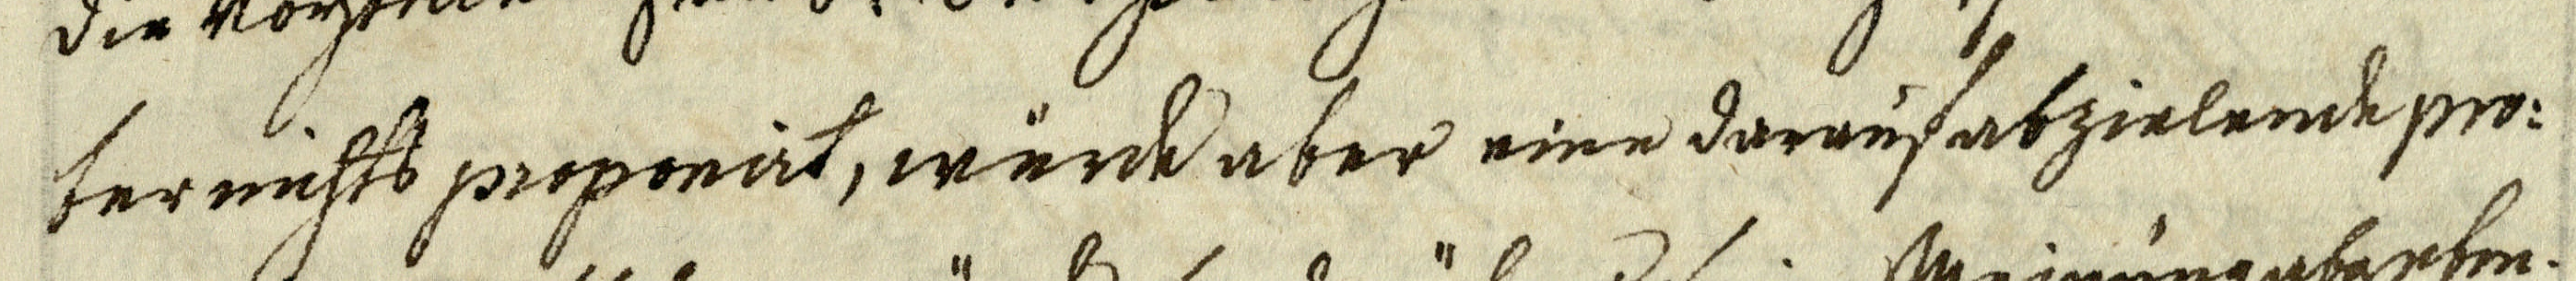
ber nichts proponirt, würde aber eine darauf abzielende pro¬
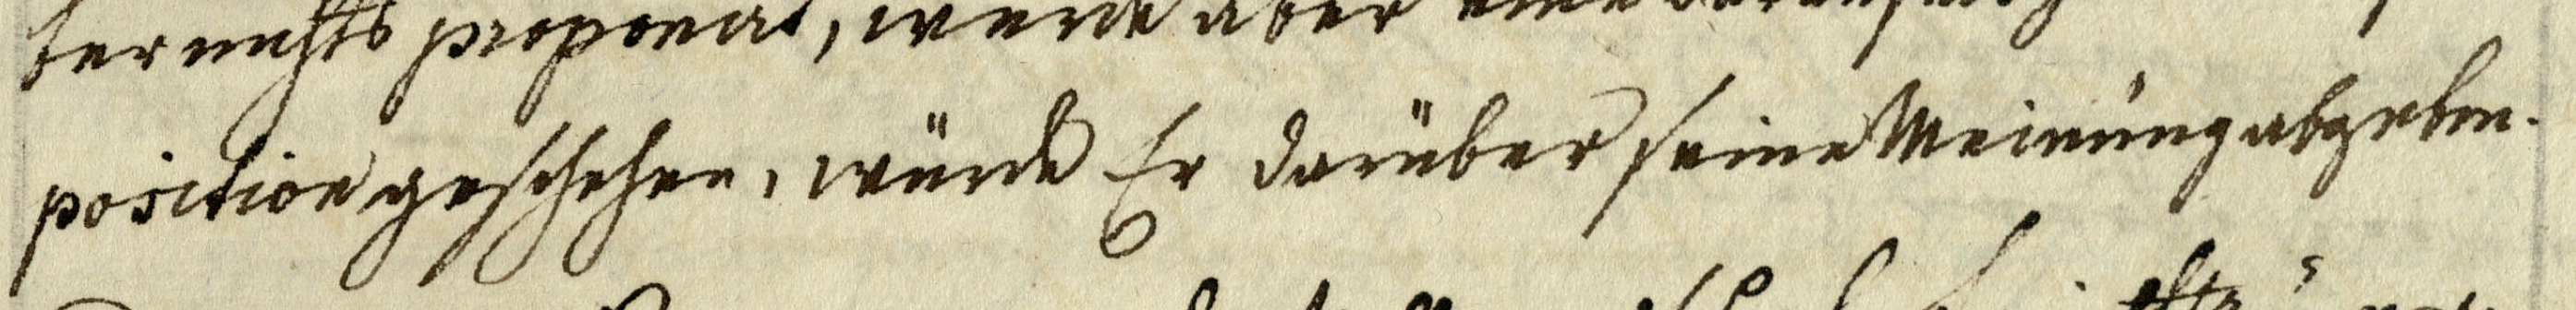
position geschehen, würde Er darüber seine Meinung abgeben.
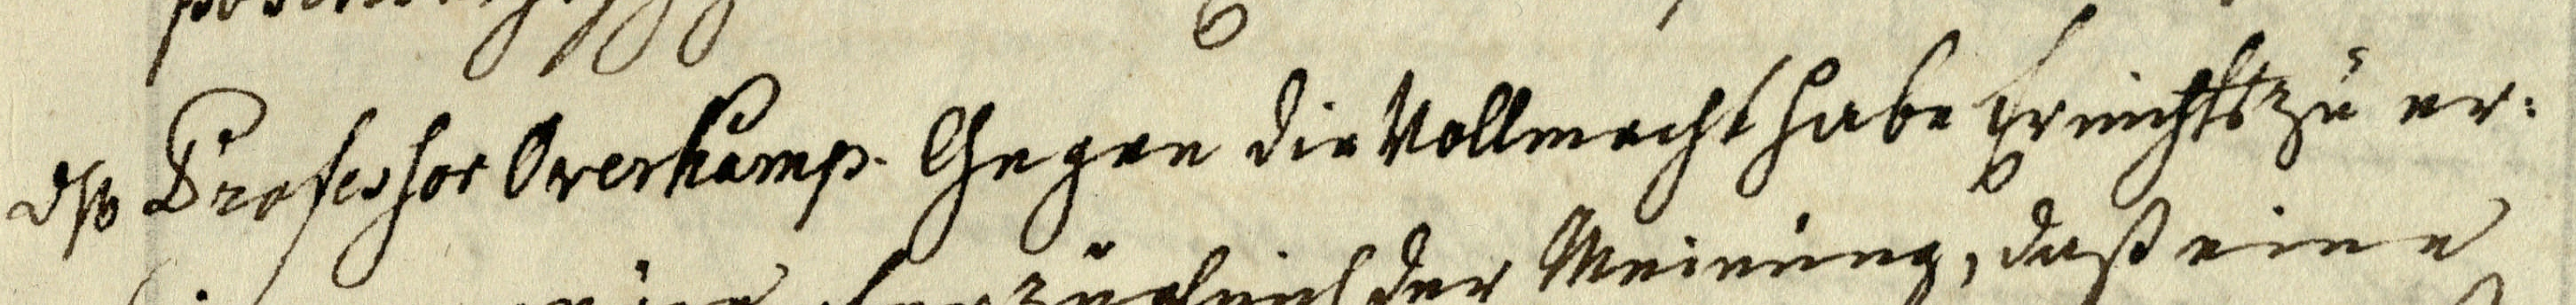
dh Professor Overkamp. Gegen die Vollmacht habe Er nichts zu er¬
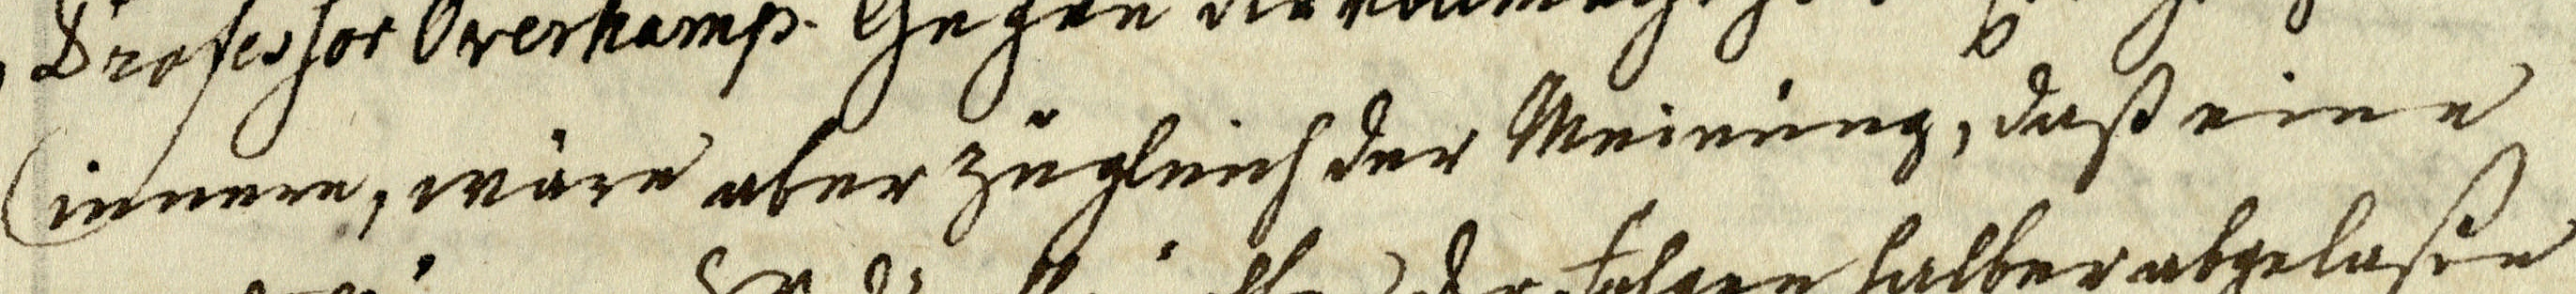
innern, wäre aber zugleich der Meinung, daß eine
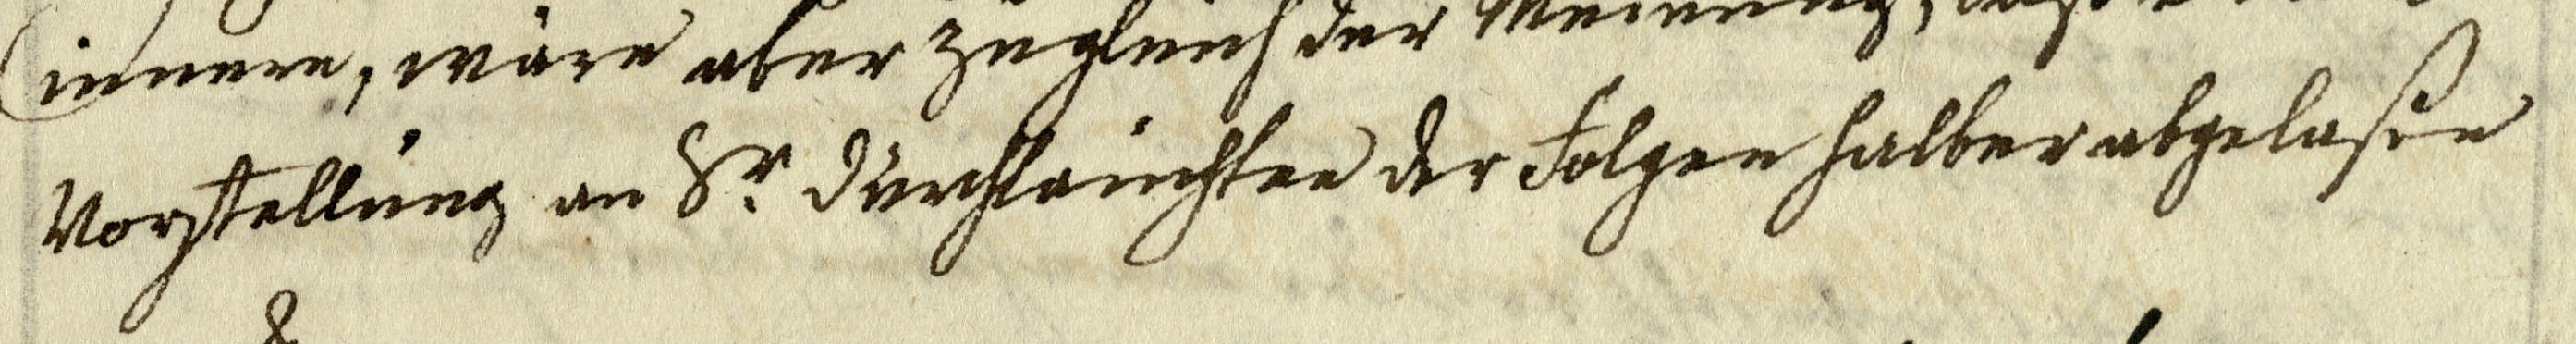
Vorstellung an Sr Durchlauchten der Folgen halber abgelaßen
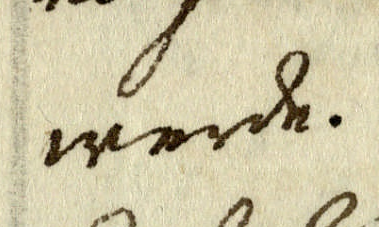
werde.
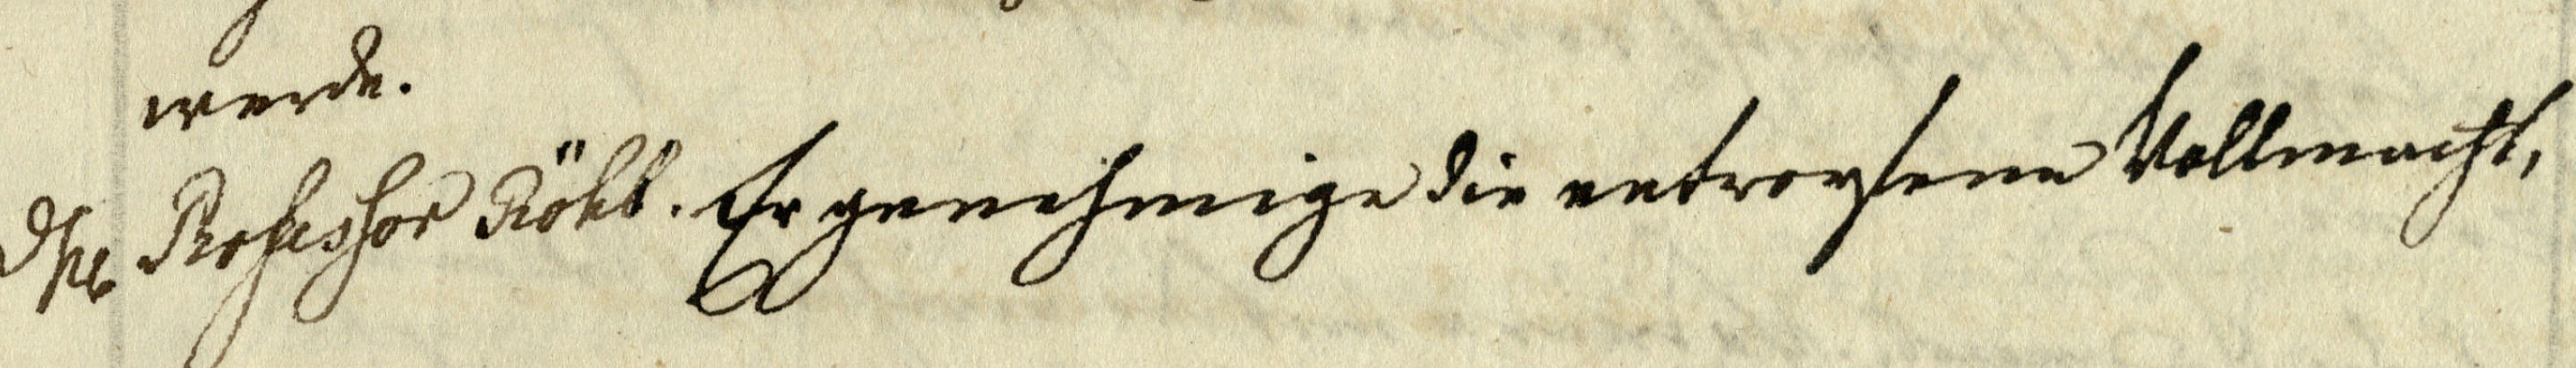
dh. Professor Röhl. Er genehmige die entworfene Vollmacht,
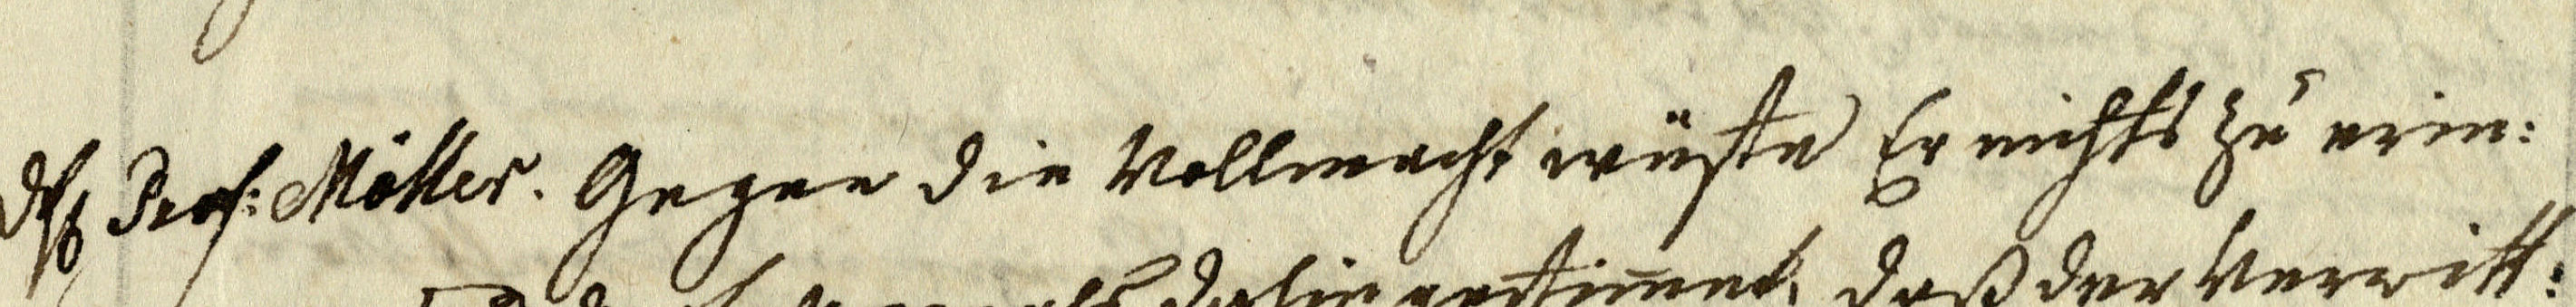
dh. Prof Möller. Gegen die Vollmacht wüste Er nichts zu erin¬
